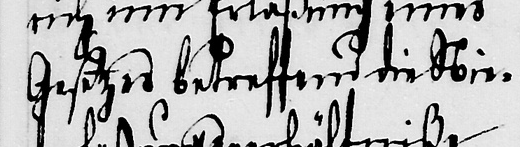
Gesetz betreffend die Nie¬
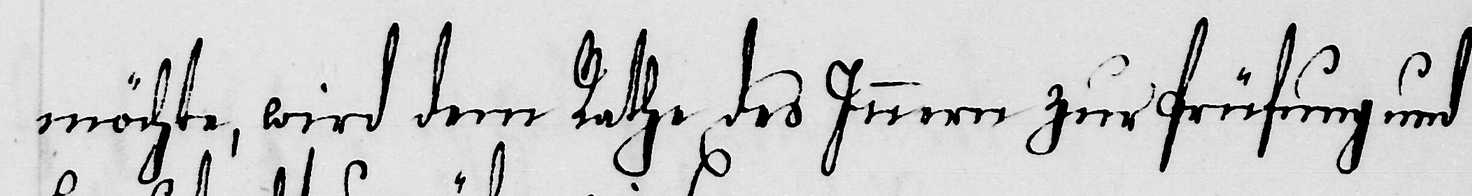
möchte, wird dem Rathe des Innern zur Prüfung und
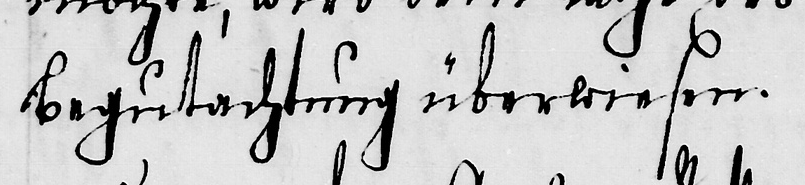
Begutachtung überwiesen.
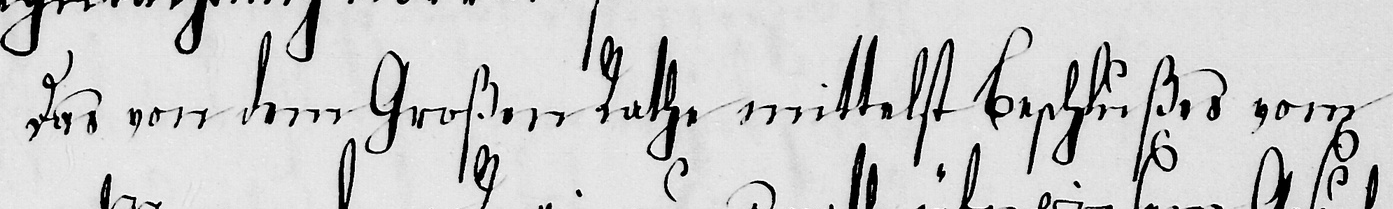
Das von dem Großen Rathe mittelst Beschlußes vom
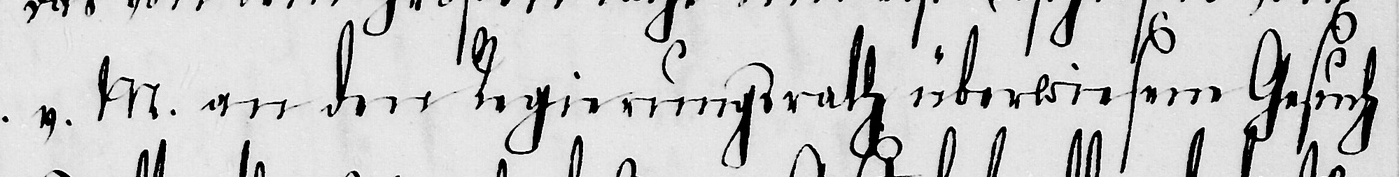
v. M. an den Regierungsrath überwiesene Gesuch
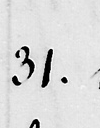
31.
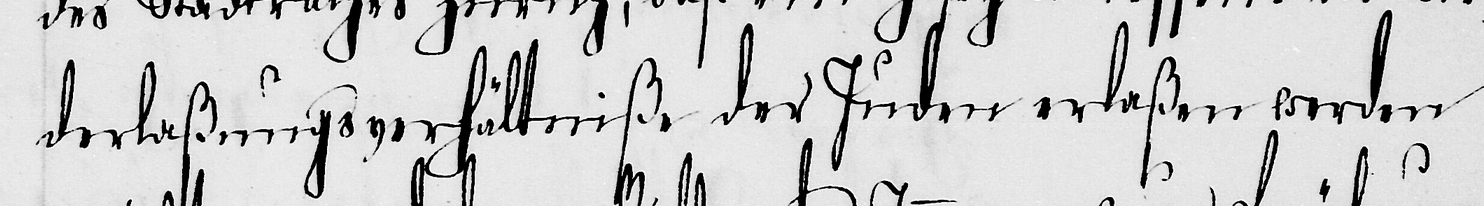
derlaßungsverhältniße der Juden erlaßen werden
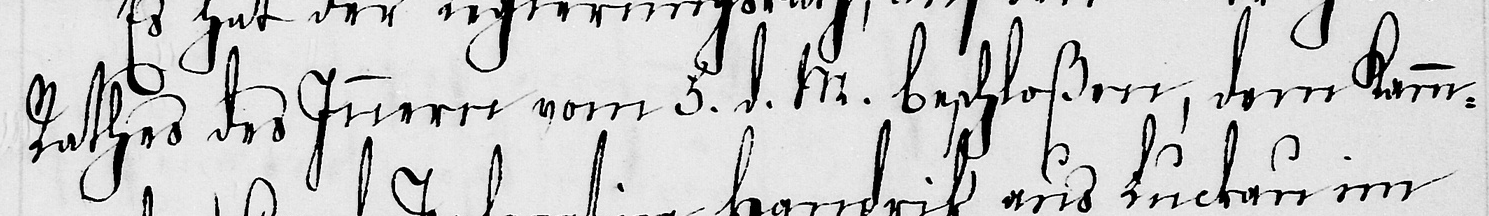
Rathes des Innern vom 5. d. M. beschloßen, dem Kam¬
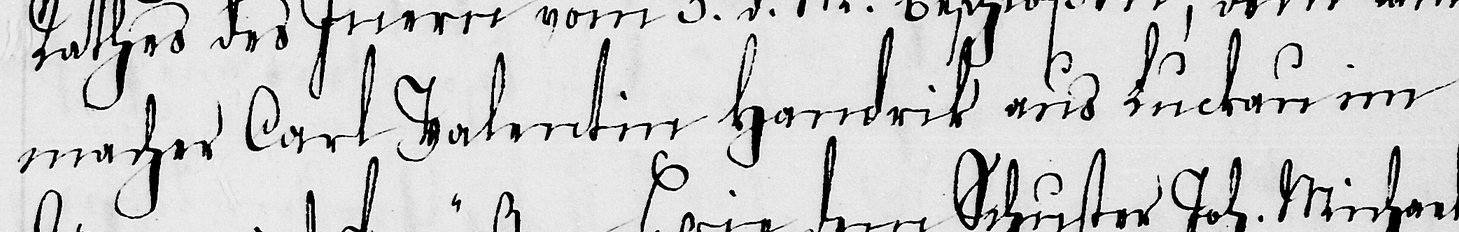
macher Carl Valentin Handrik aus Luckau im
